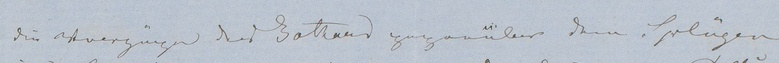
die Vorzüge des Gothard gegenüber dem Splügen
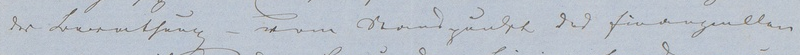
der Berathung – vom Standpunkt des finanziellen
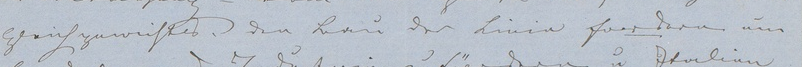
Gleichgewichtes, den Bau der Linie fordern um
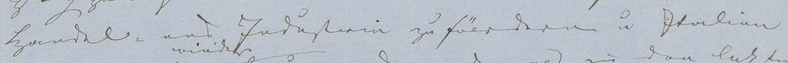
Handel – und Industrie zu fördern u Italien
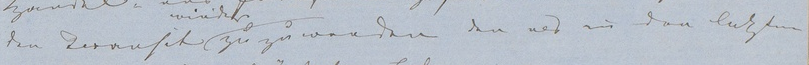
den Transit wieder zuzuwenden den es in den letzten
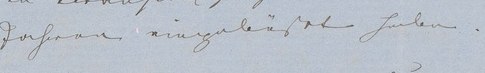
Jahren eingebüßt habe. –
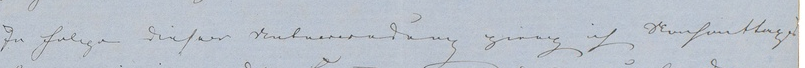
In Folge dieser Unterredung gieng ich Nachmittags
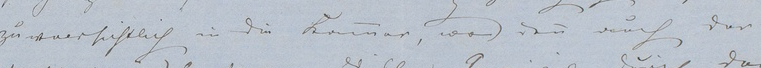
zuversichtlich in die Kammer, wo dann auch der
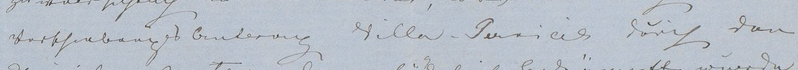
Verschiebungs Antrag Villa-Penricis durch den
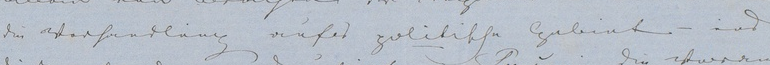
die Verhandlung aufs politische Gebiet – und
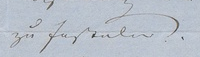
zu feßeln. –
